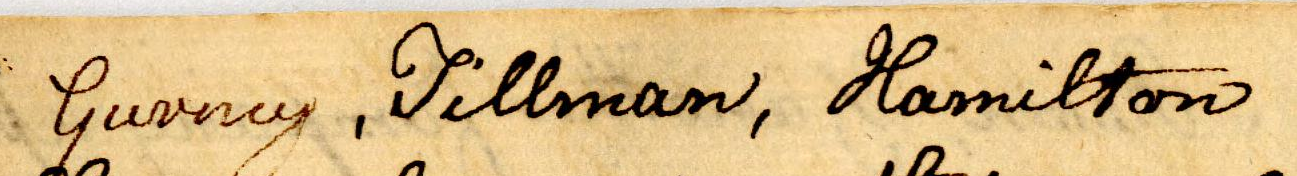Gurney, Tillman, Hamilton
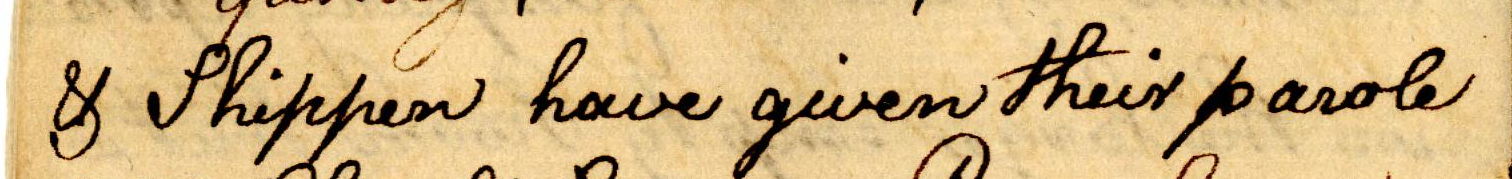& Shippen have given their parole
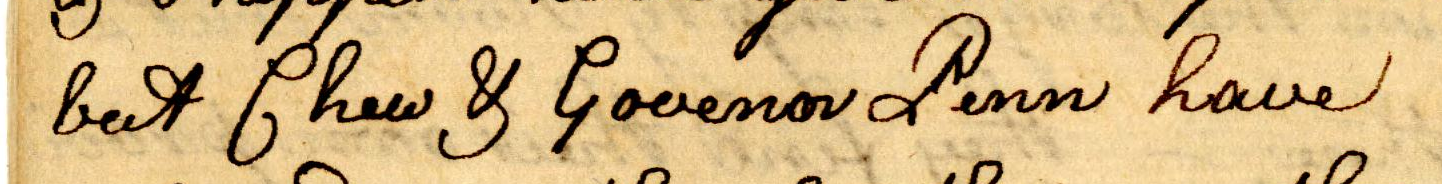but Chew & Govenor Penn have
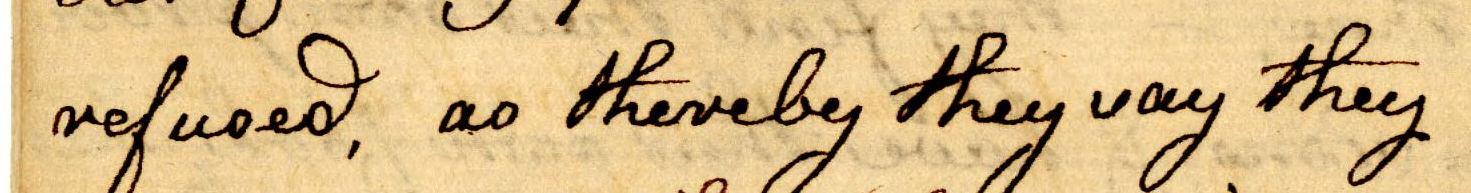refused, as thereby they say they
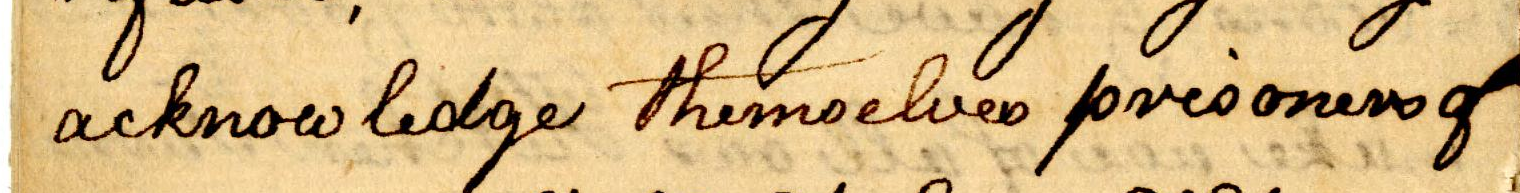acknowledge themselves prisoners of
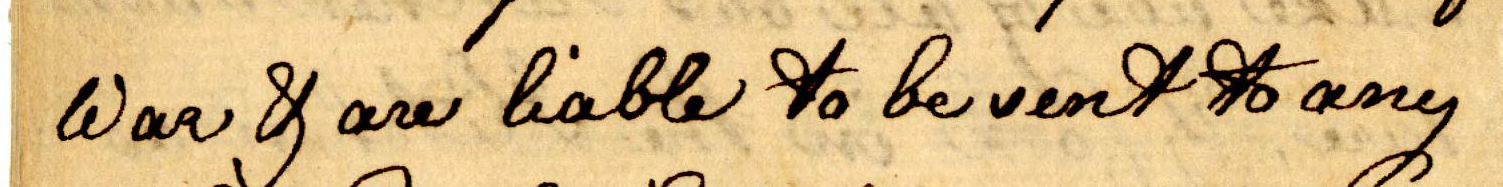War & are liable to be sent to any
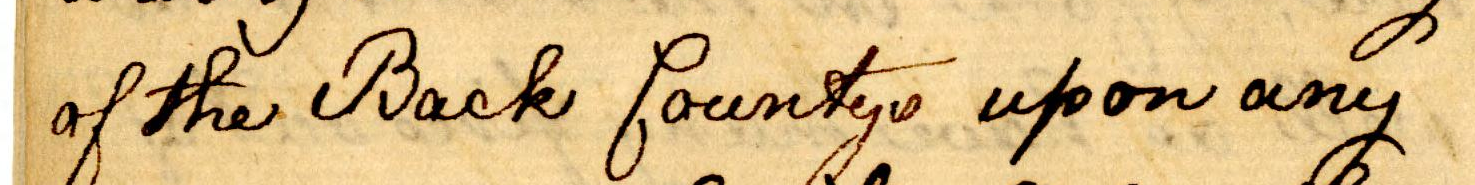of the Back Countys upon any
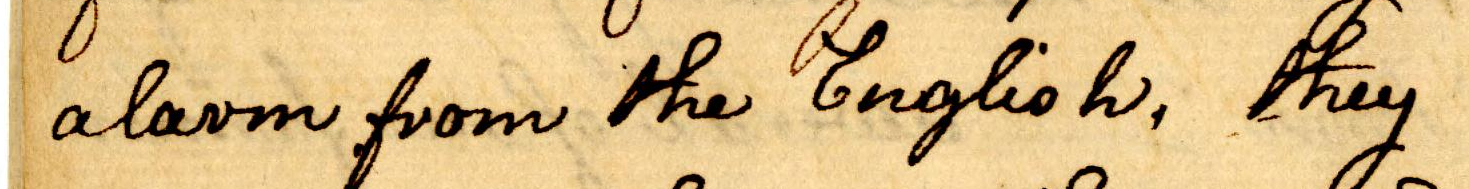alarm from the English, they
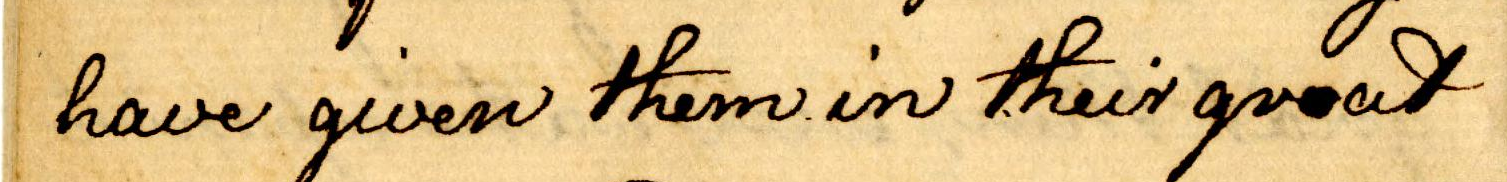have given them in their great
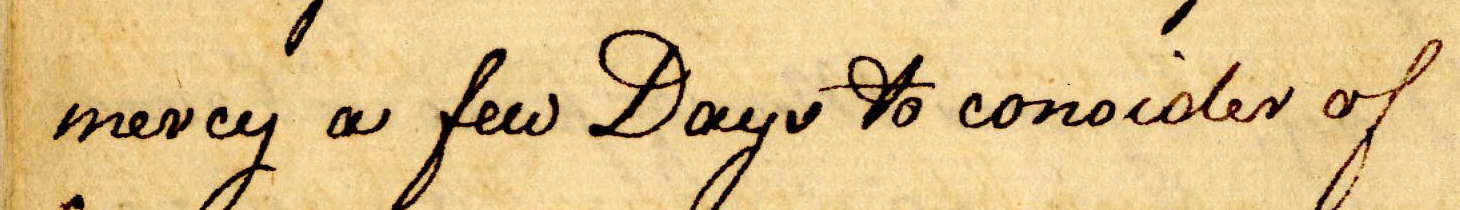mercy a few Days to consider of
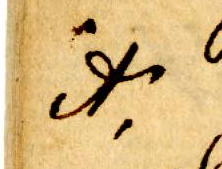it,
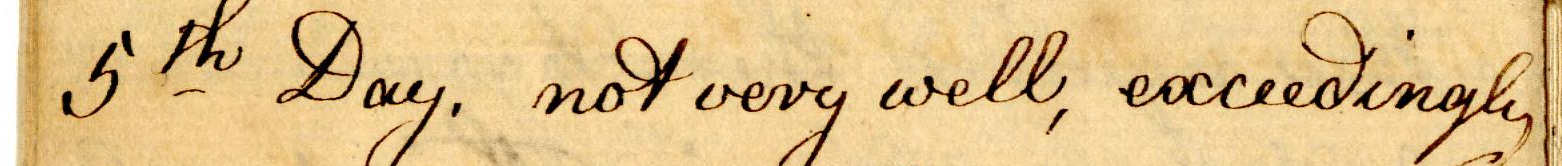5^th Day. not very well, exceedingly
